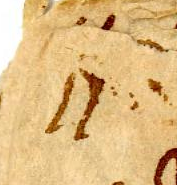17
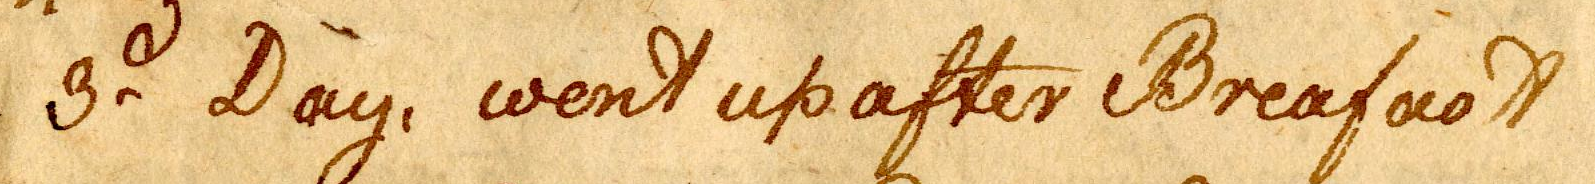3^d Day, went up after Breakfast
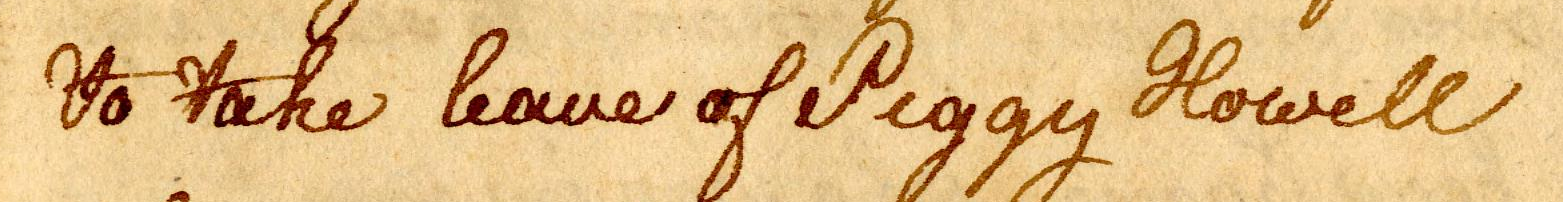to take leave of Peggy Howell
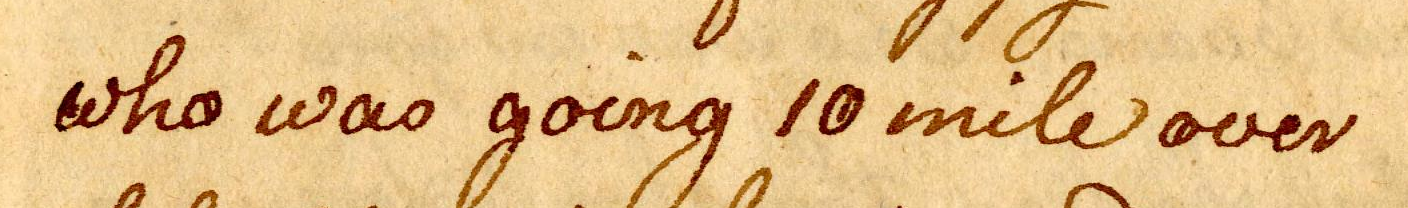who was going 10 mile over
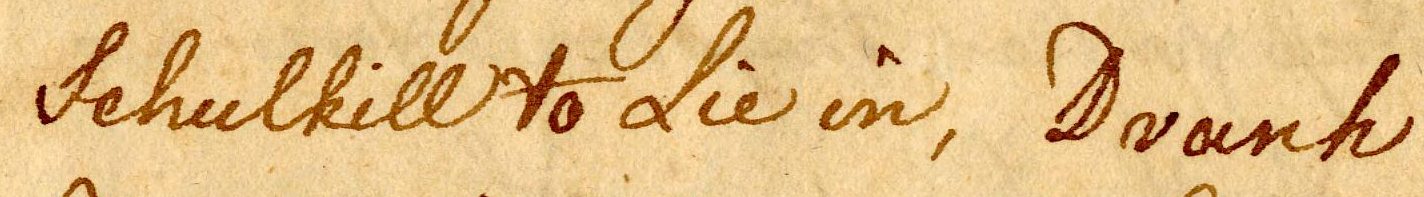Schulkill to Lie in, Drank
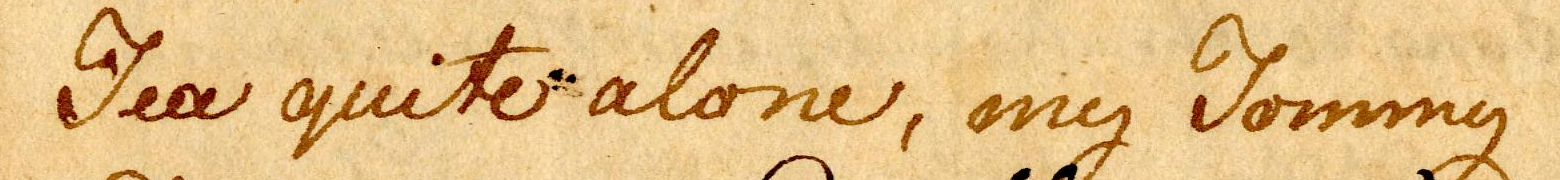Tea quite alone, my Tommy
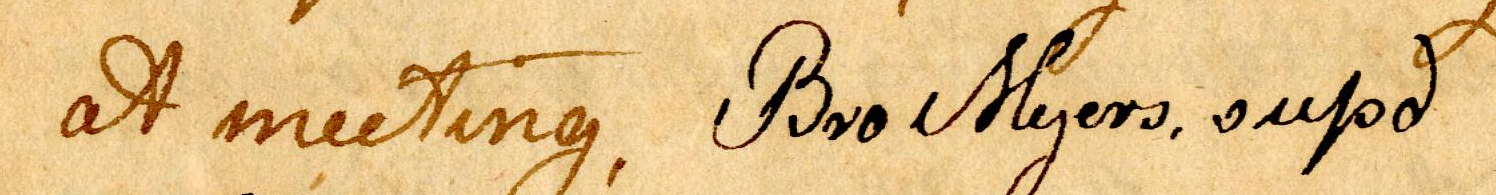at meeting, Bro Myers, supd
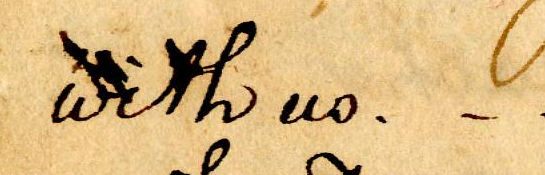with us.-
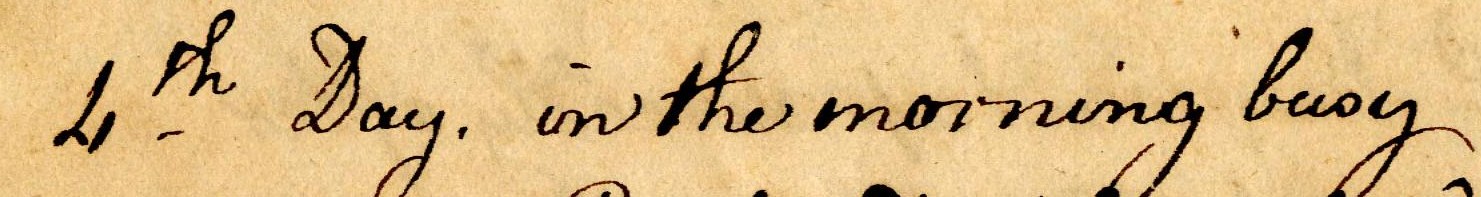4^th Day. in the morning busy
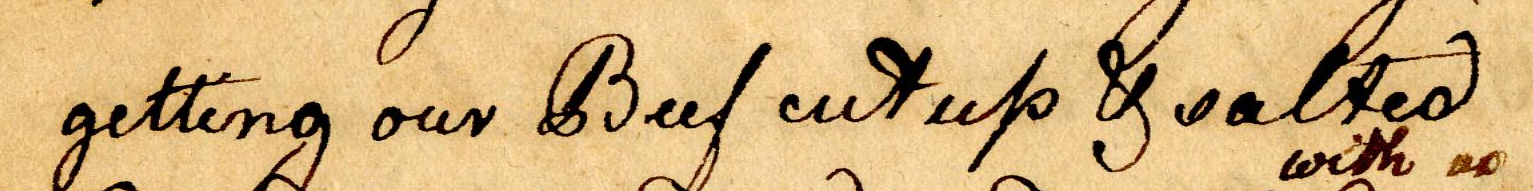getting our Beef cut up & salted
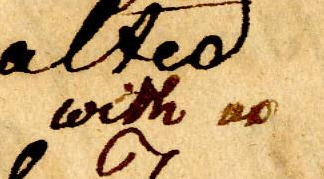with us
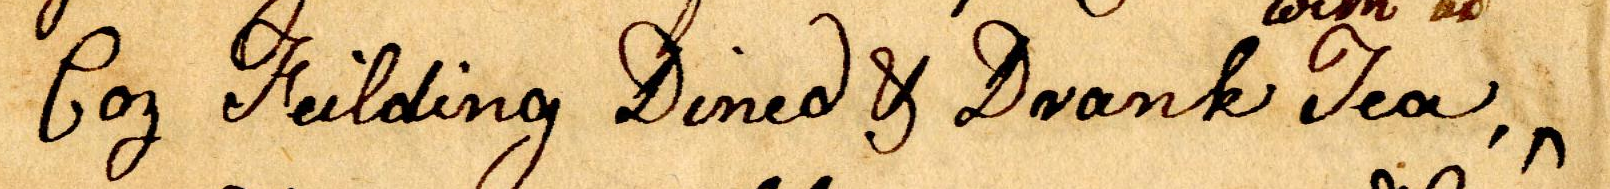Coz Feilding Dined & Drank Tea, ^
